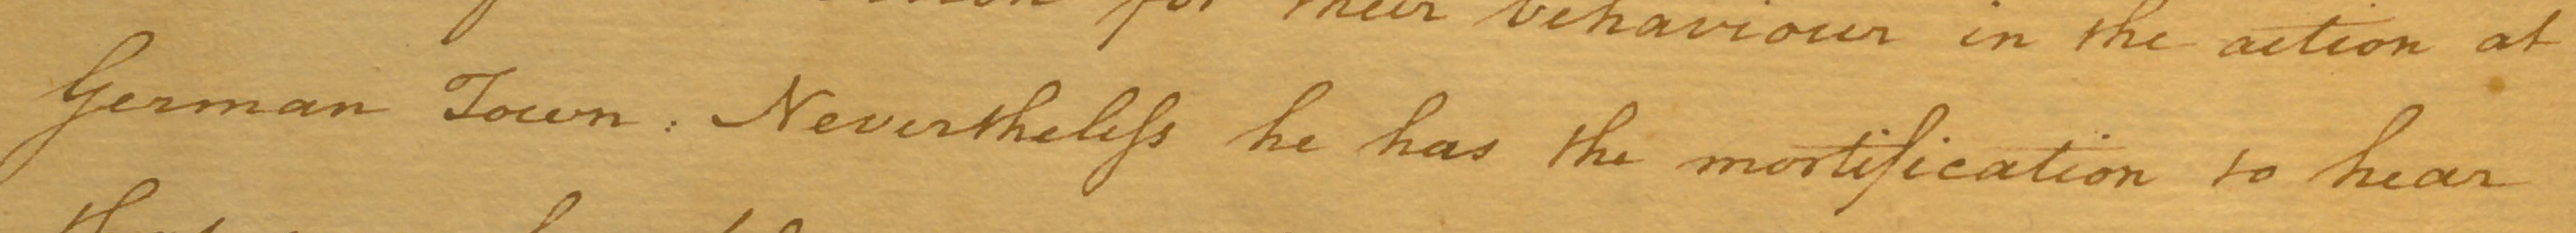German Town. Nevertheless he has the mortification to hear
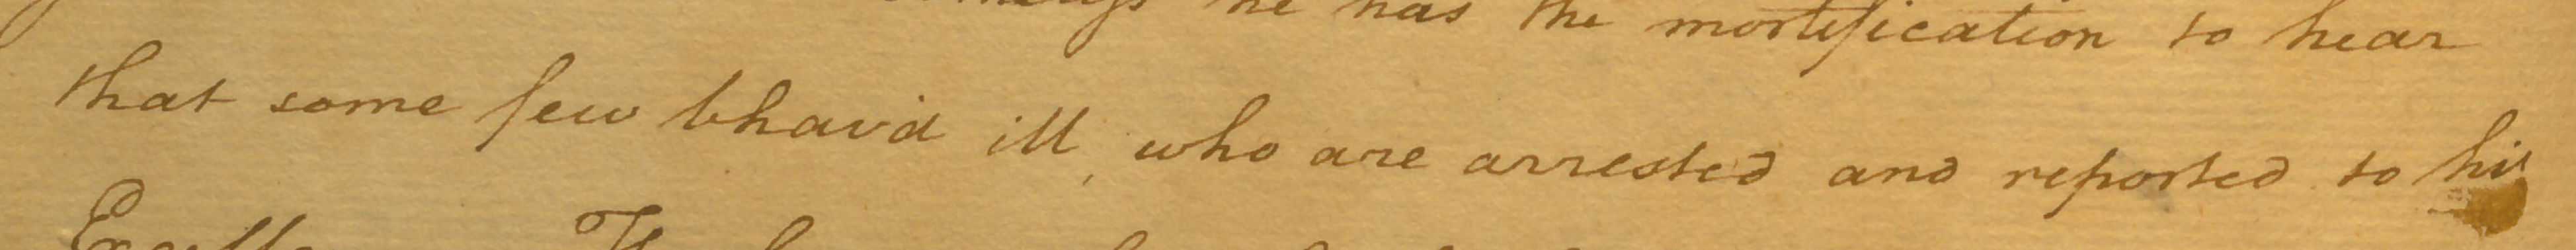that some few bhav'd ill who are arrested and reported to his
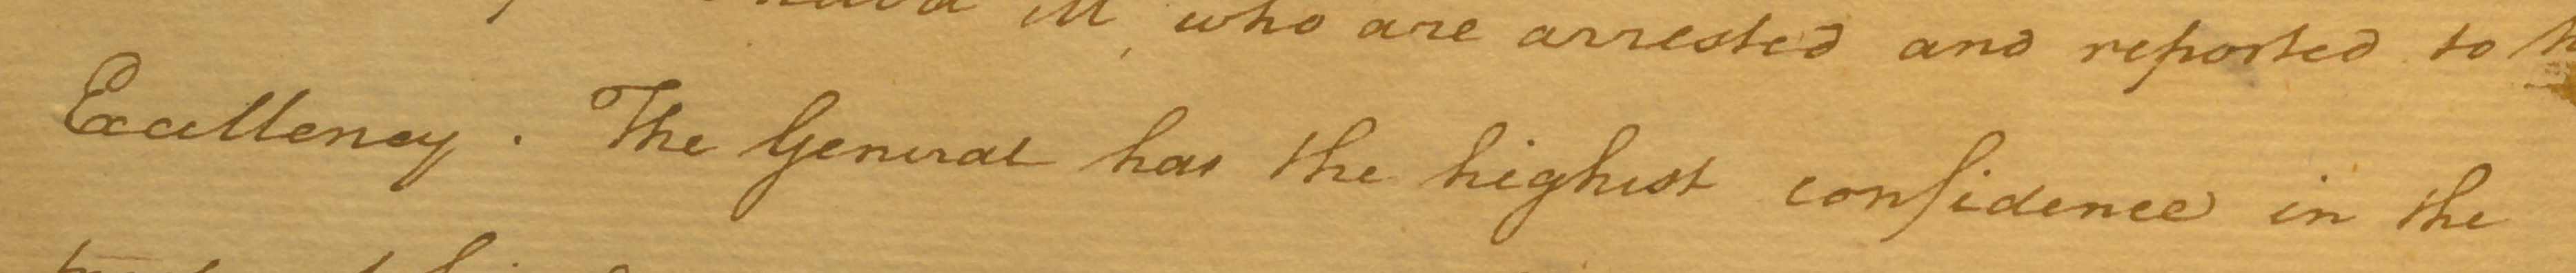Excellency. The General has the highest confidence in the
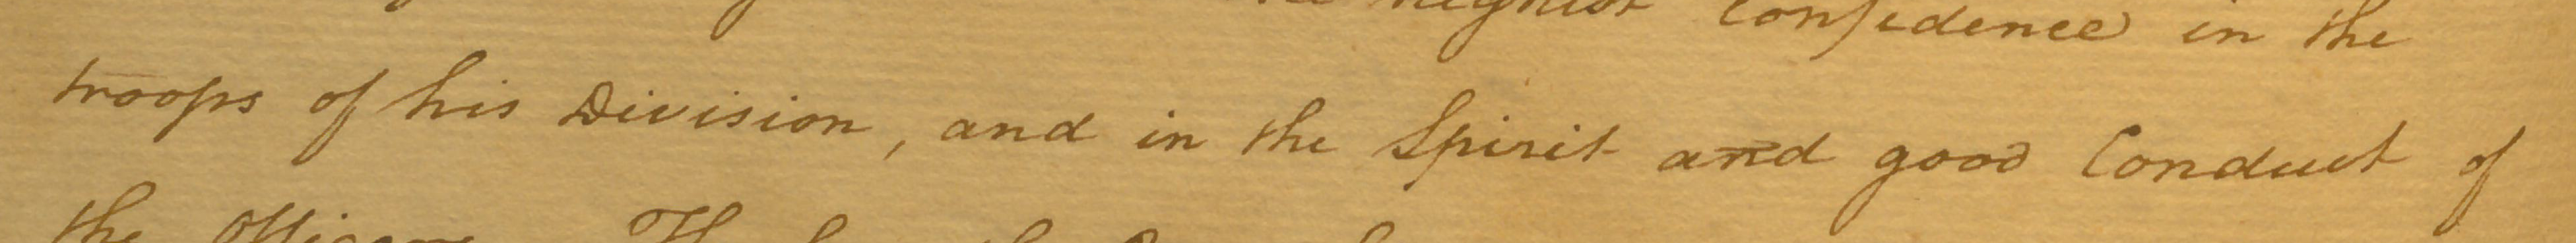troops of his Division, and in the Spirit and good Conduct of
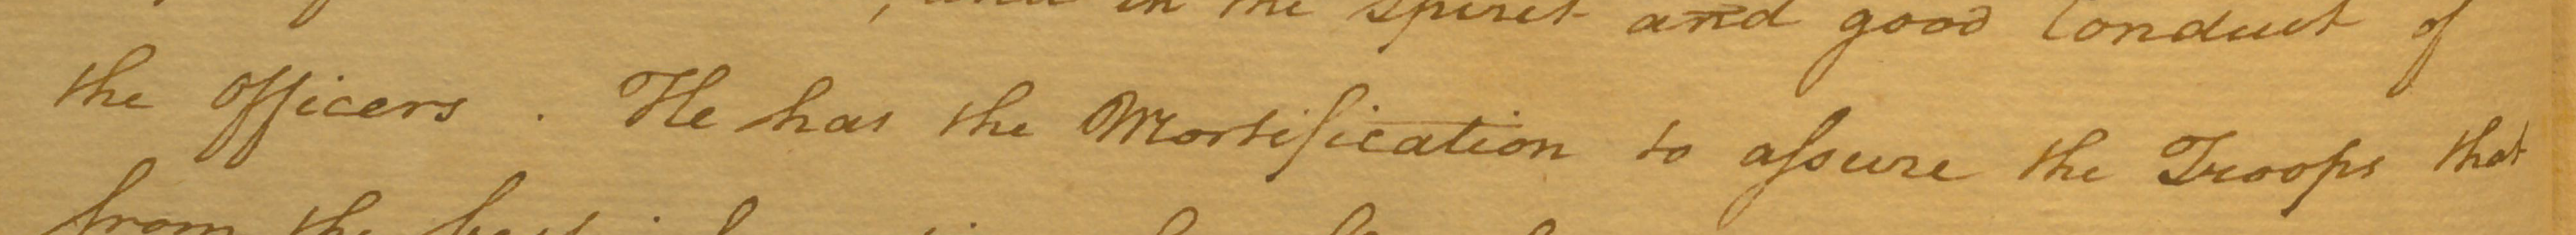the Officers. He had the Mortification to assure the Troops that
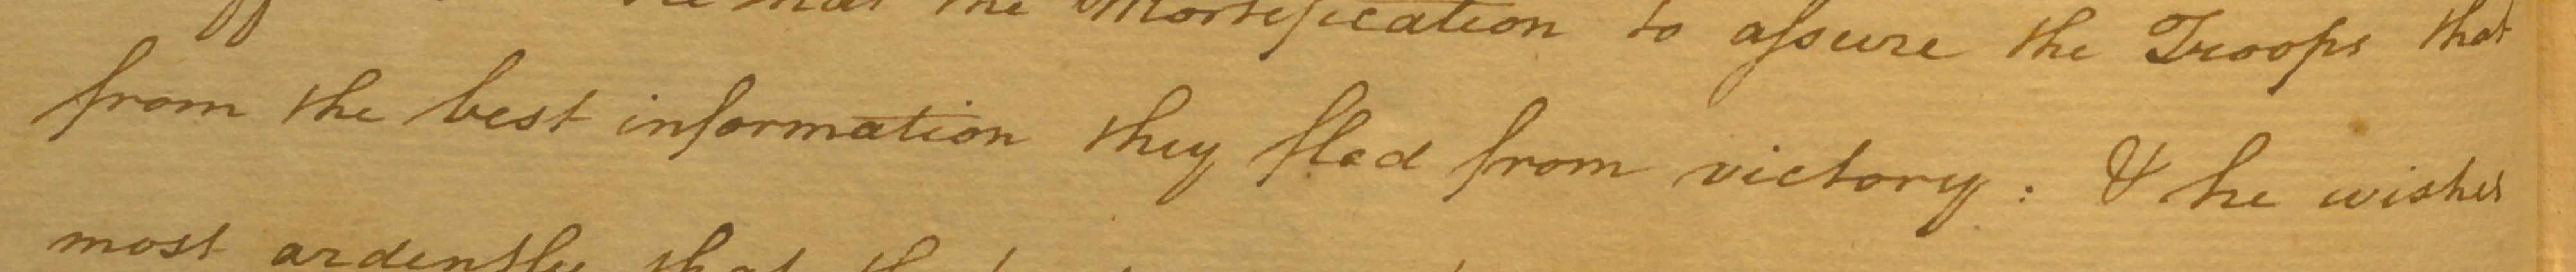from the best information they fled from victory, & he wishes
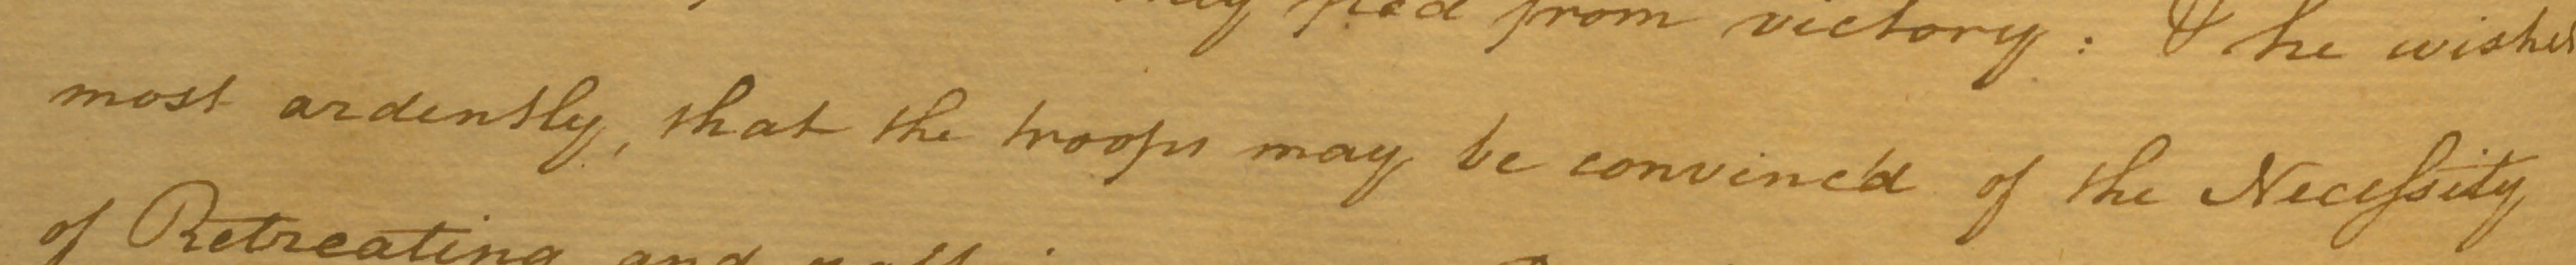most ardently that the troops may be convinc'd of the Necessity
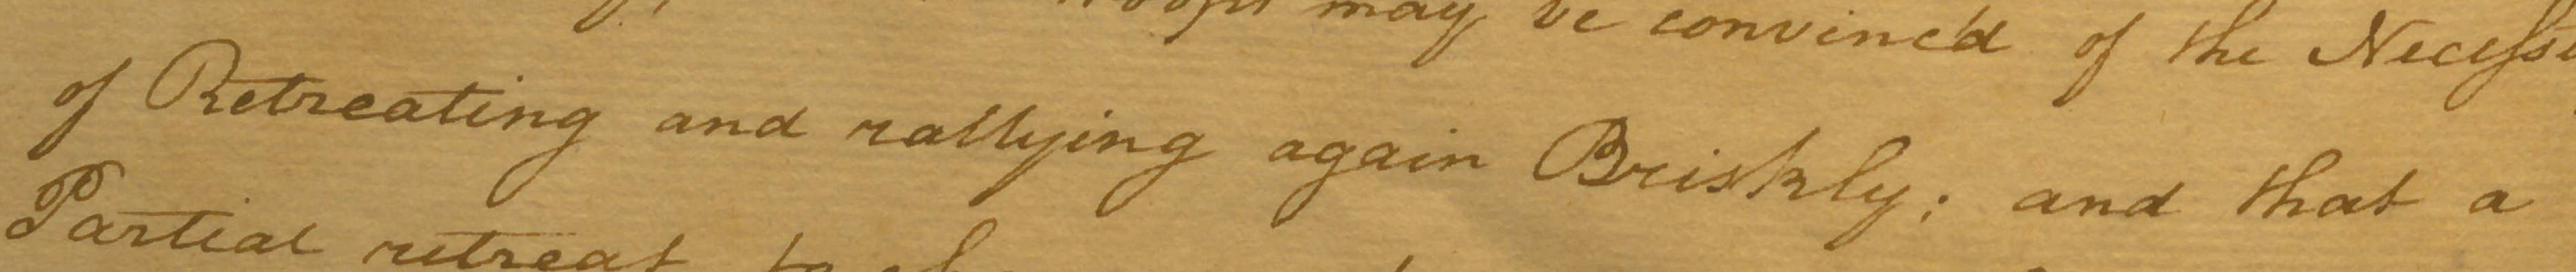of Retreating and rallying again Briskly; and that a
